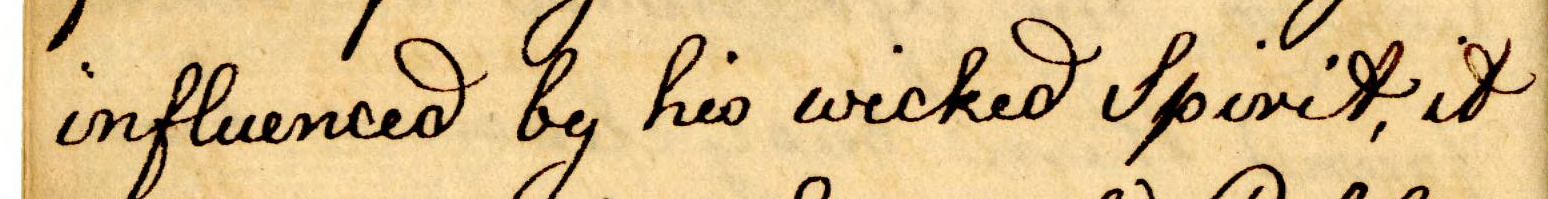influenced by his wicked Spirit, it
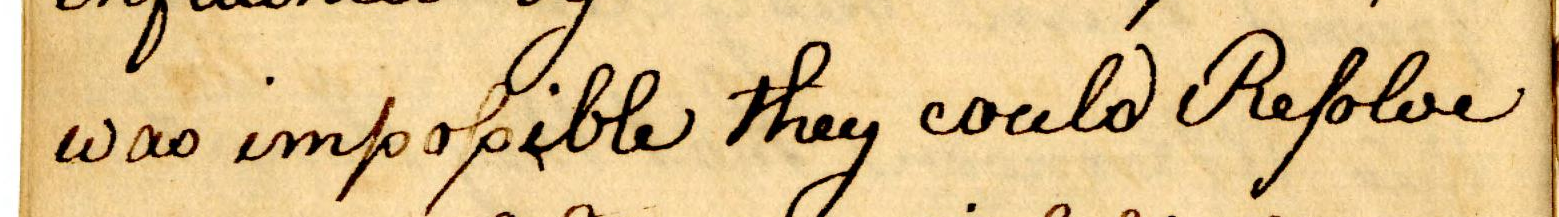was impossible they could Resolve
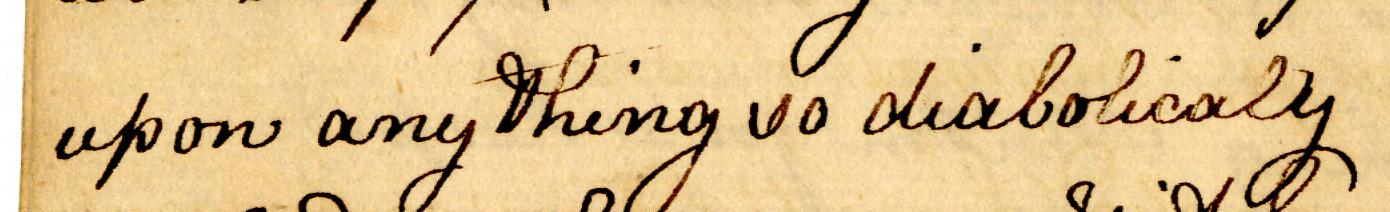upon anything so diabolically
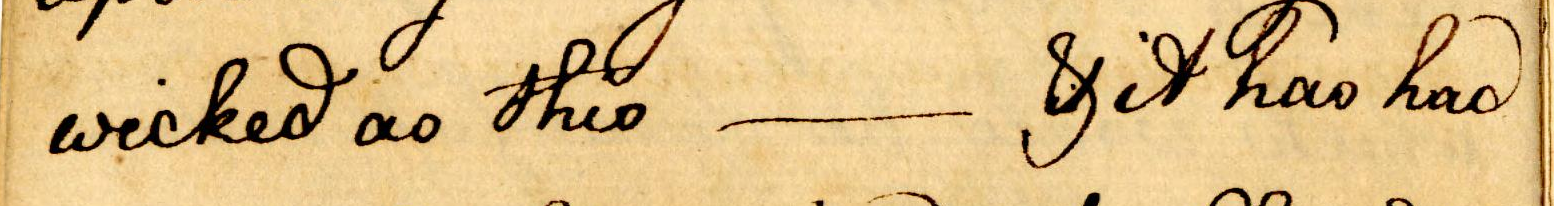wicked as this- & it has had
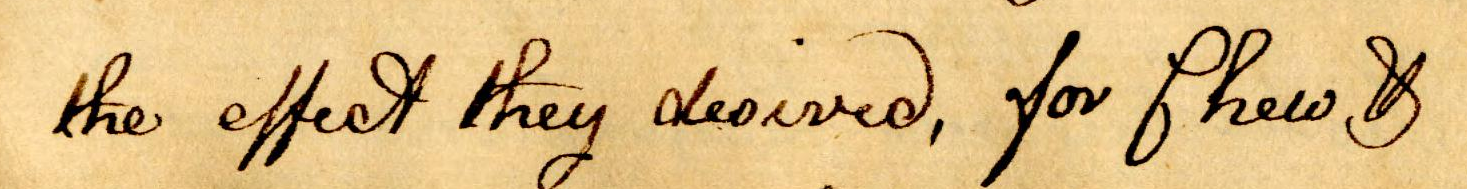the effect they desired, for Chew &
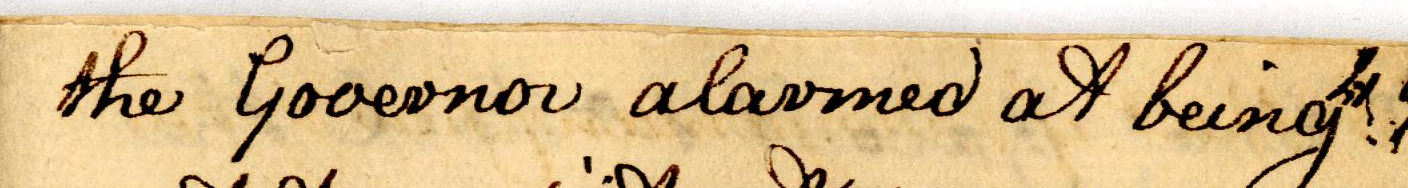the Governor alarmed at being
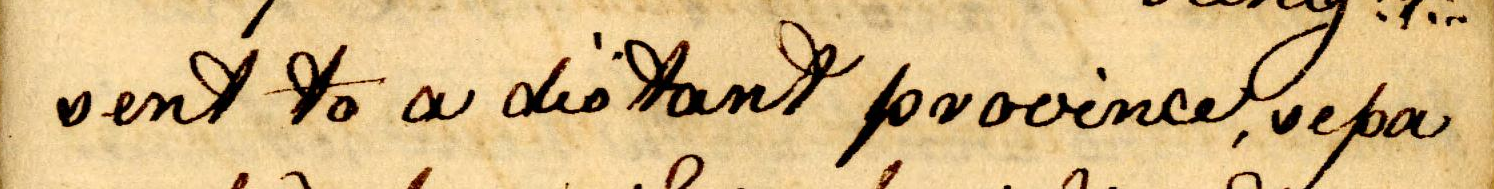sent to a distant province, sepa
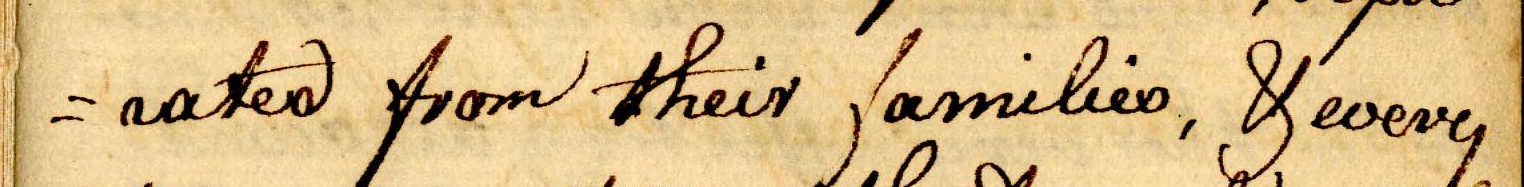-rated from their families, & every
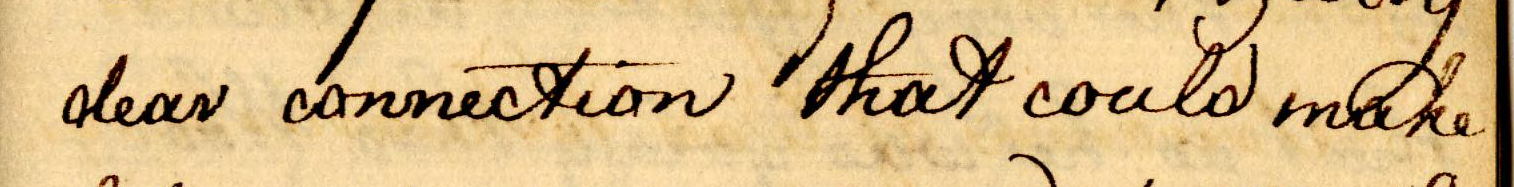dear connection that could make
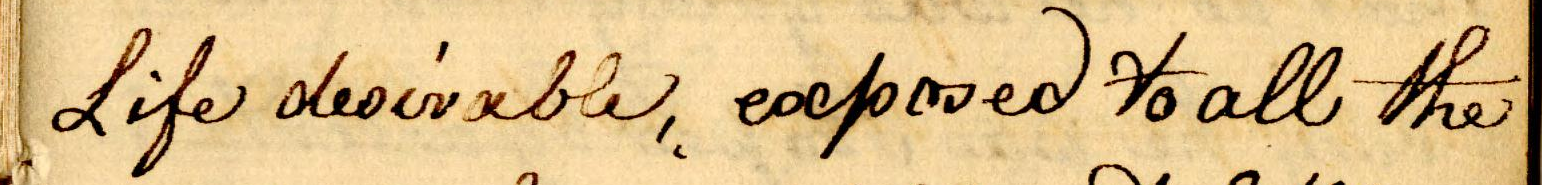Life desirable, exposed to all the
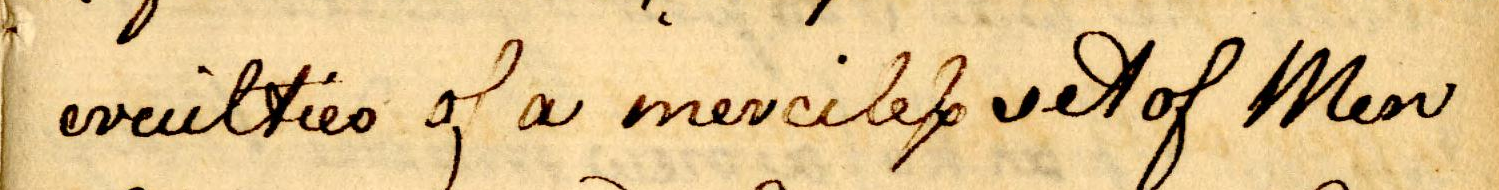cruilties of a merciless set of Men
